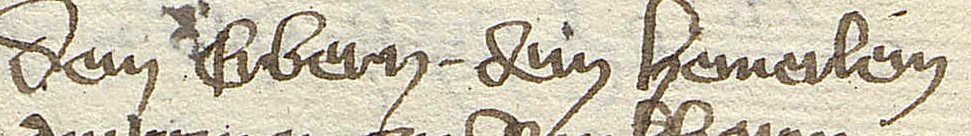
Dem Erbern . dem Hemerlein
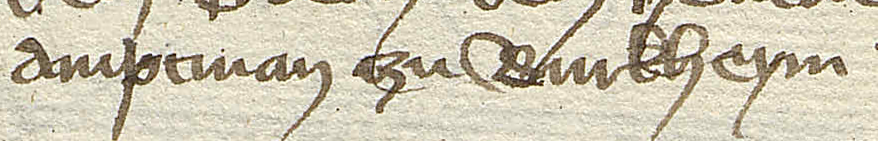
Amptman cʒu Burkheym
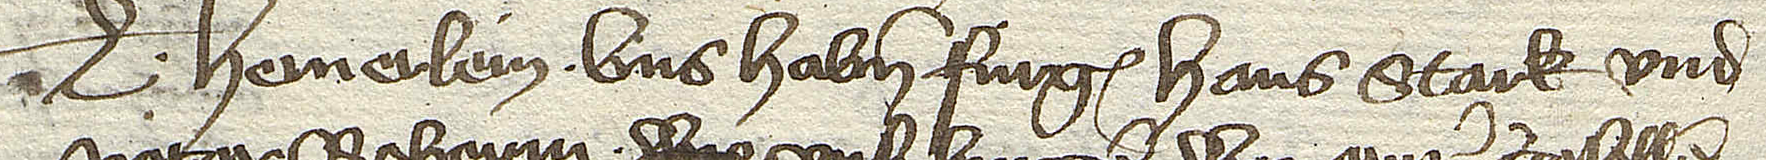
L* . hemerlein . Vns hab*n fürg* hans Stark vnd
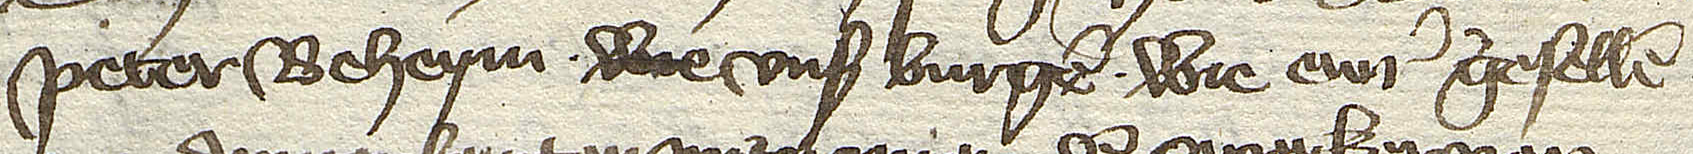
peter Beheym . wie vnſ* burge* . wie ewr* geſelle*
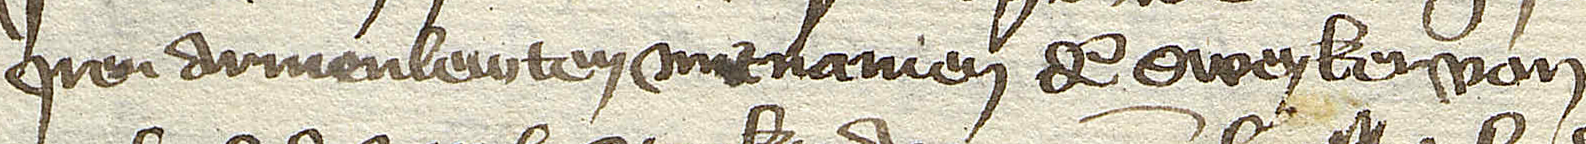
Iren Armenlewten mit namen d* Sweyker von
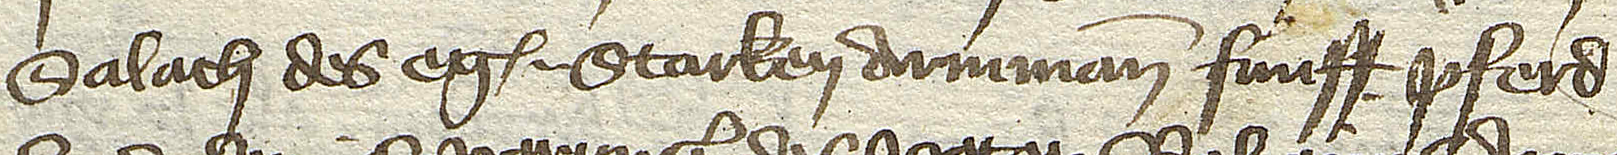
Salach des eg* ~ Starken Armman* fünff pferd
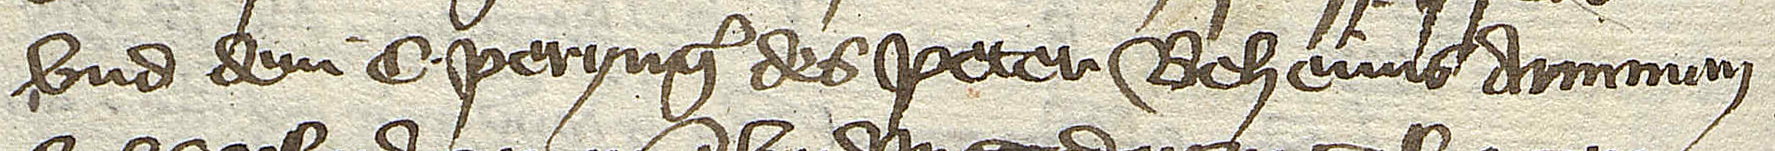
vnd dem . C . peryng* des peter Beheims Armman
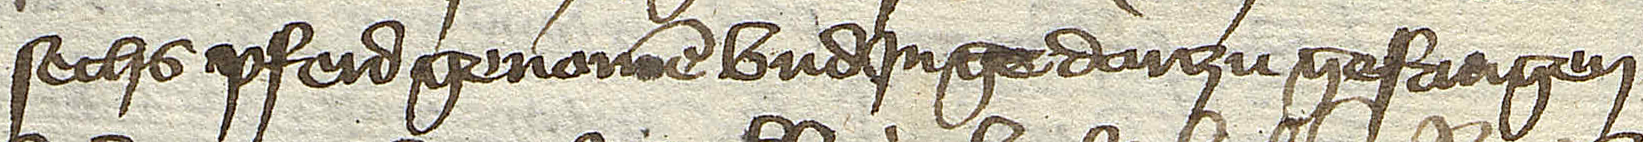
ſechs pferd genome* vnd In ge darcʒu gefangen
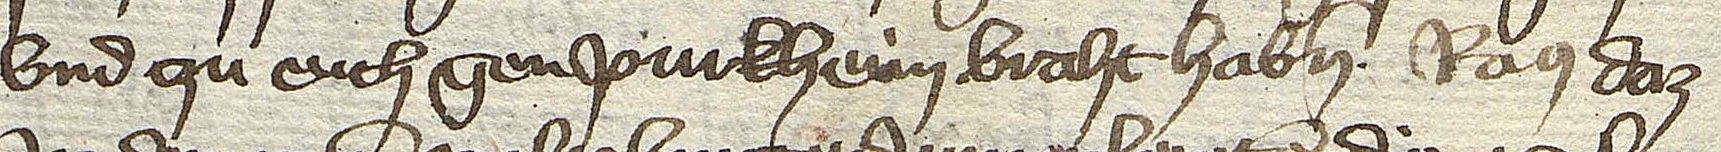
vnd cʒu euch gen purkheim braht hab*n . Ro* daʒ
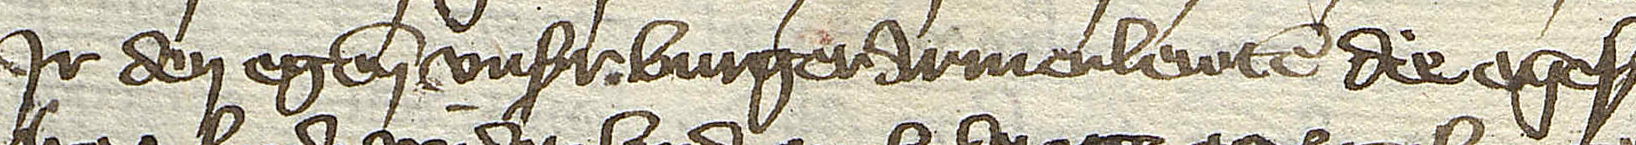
Ir den egen* vnſ*r burger Armenlewte* die egeſ*
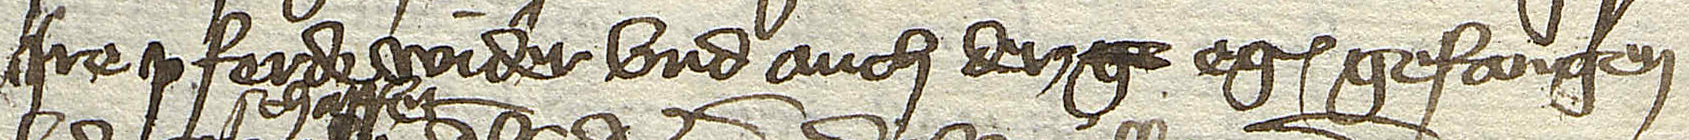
Ire pferde wider vnd auch der ge eg* gefangen
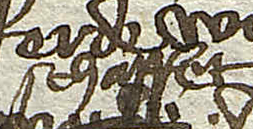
ſchaffet
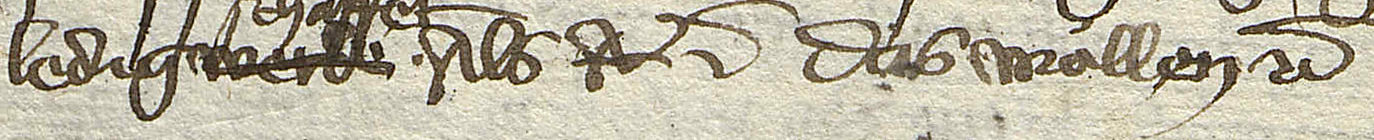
ledig werde . Als A ec* das wöllen ec*
